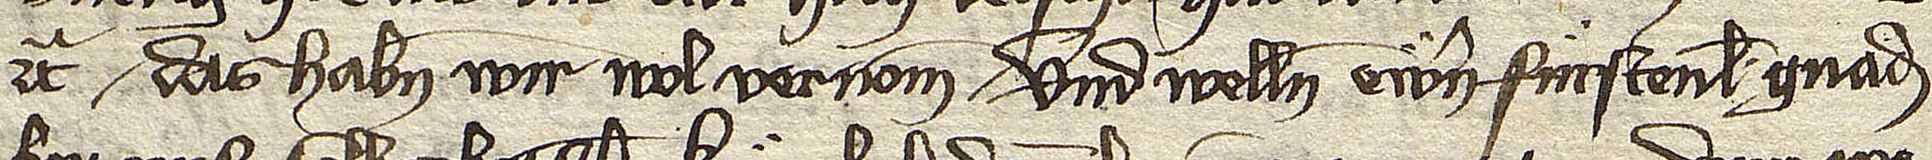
ec* / das habn* wir wol vernom* / Vnd welln* eẅ*n fürſtenl* gnad*
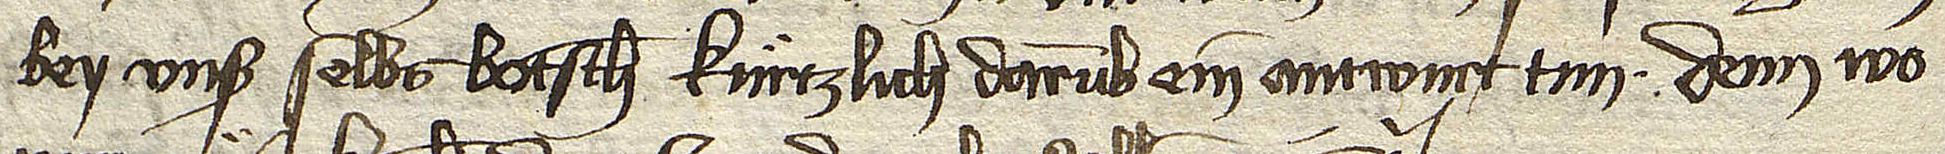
bey vnſ* ſelbs botſch* kürcʒlich darub* ein antwurt tun . Denn wo
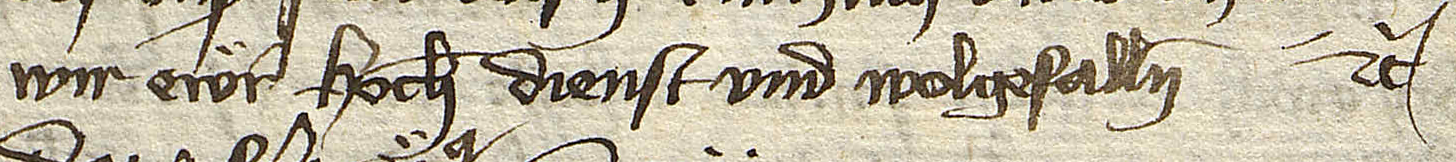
wir eẅr* Hoch* dienſt vnd wolgefalln* ec*
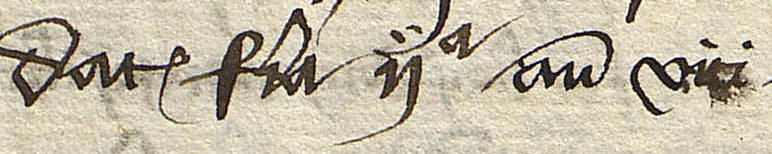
Dat* fi*a ii* an* viti* -
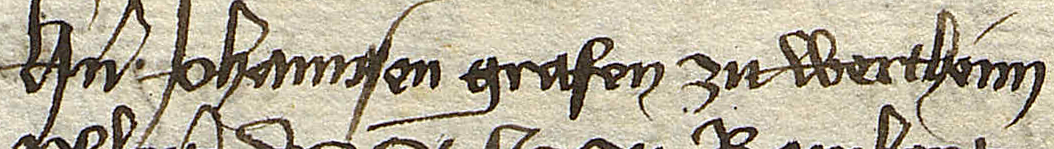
Hn* Iohannſen grafen ʒu wertheim
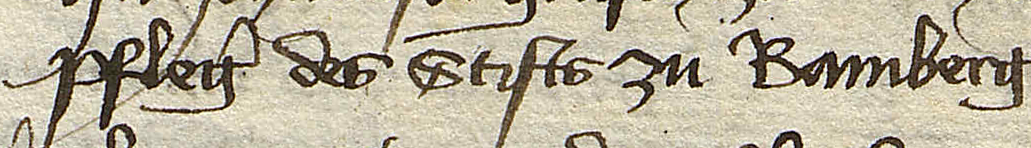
Pfleg* des Stifts ʒu Bamberg
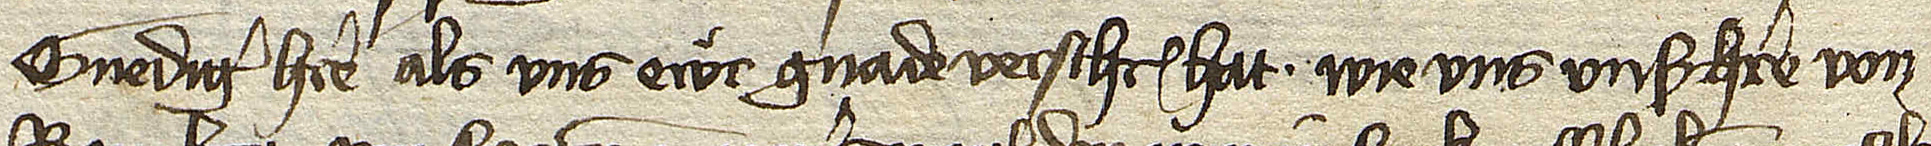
Gnedig* h*re als vns eẅr gnade verſchr* hat . wie vns vnſ* h*re von
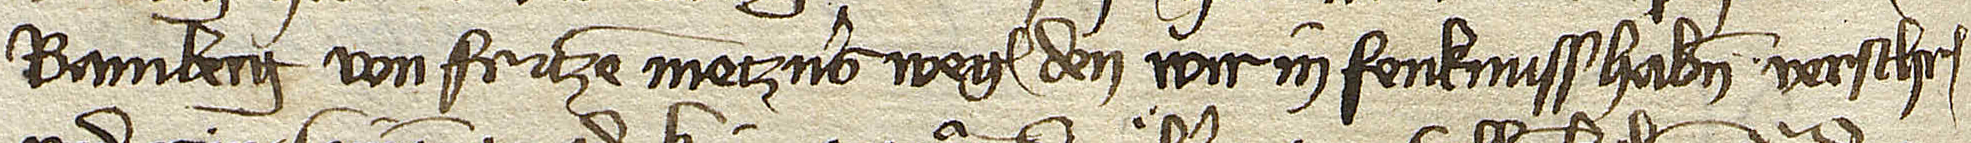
Bamberg von fricʒe* mecʒn*s weg* den wir in fenknuſſ habn* verſchr*
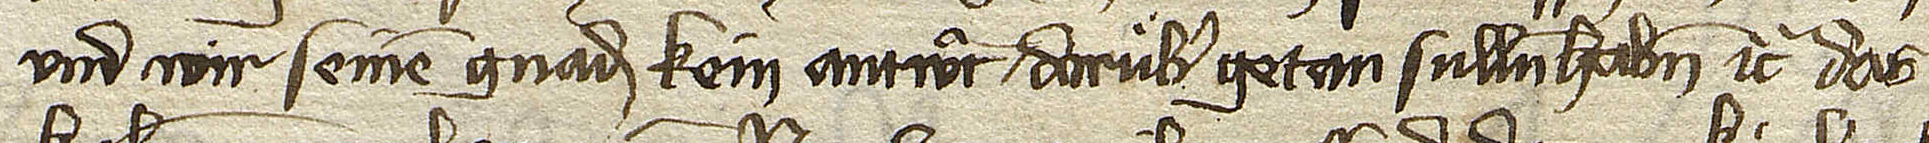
vnd wir ſeine* gnad* kein antw*t / darüb* getan ſulln* habn* ec* das
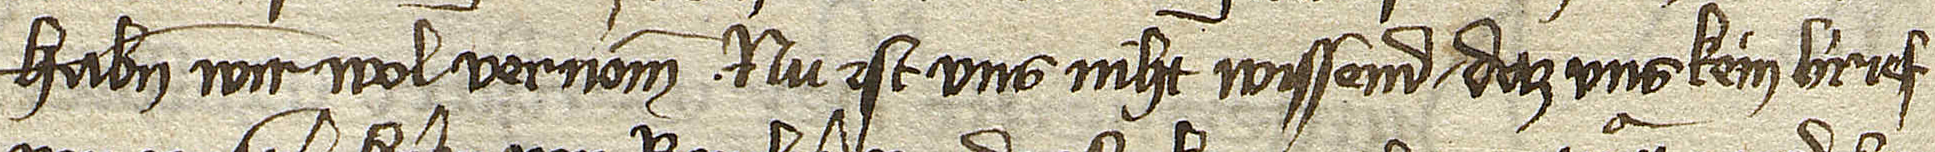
habn* wir wol vernom* . Nu iſt vns niht wiſſend / daʒ vns kein brief
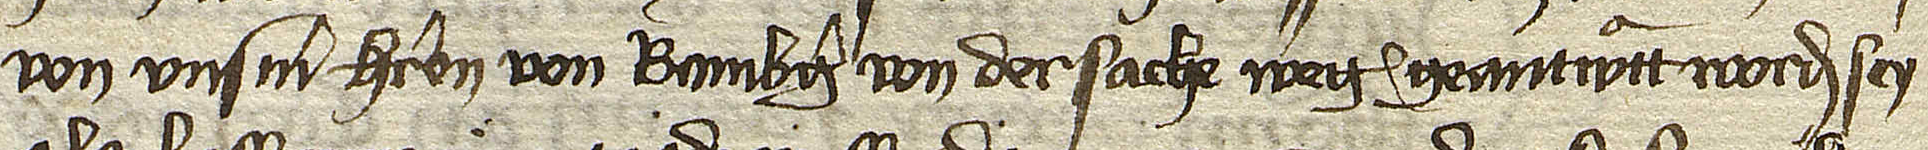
von vnſm* h*ren von Bamb*g von der ſache weg* geantw*tt word* ſey
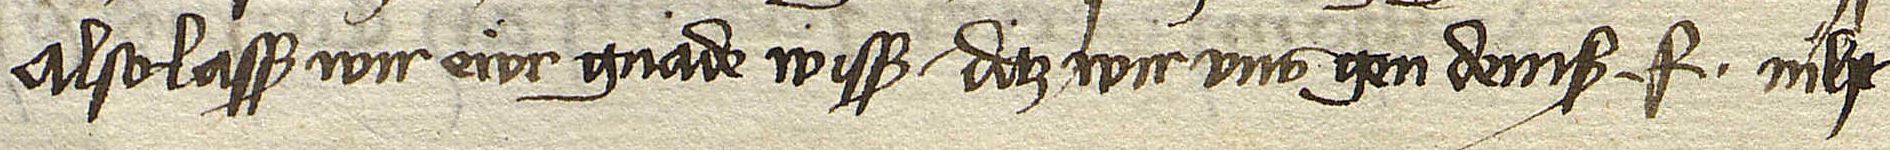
Alſo laſſ* wir eẅr gnade wiſſ* / daʒ wir vns gen demſ* . F . niht
